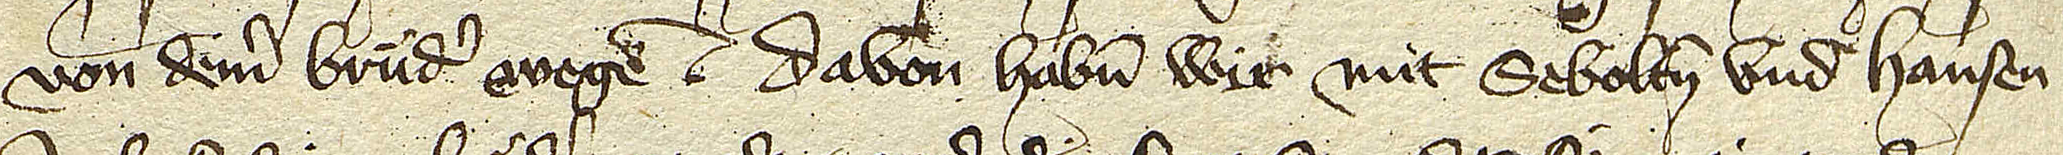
von dein* brüd* wege* / Davon habn* wir mit Seboltn* vnd Hanſen
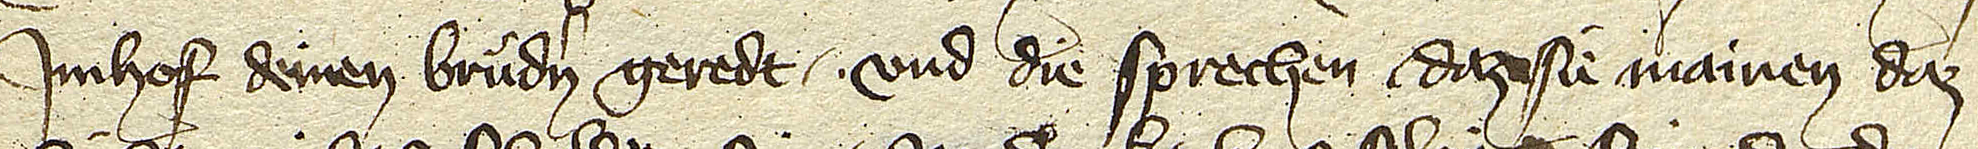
Imhof deinen brüdn* geredt / . vnd die ſprechen / daʒ ſie mainen daʒ
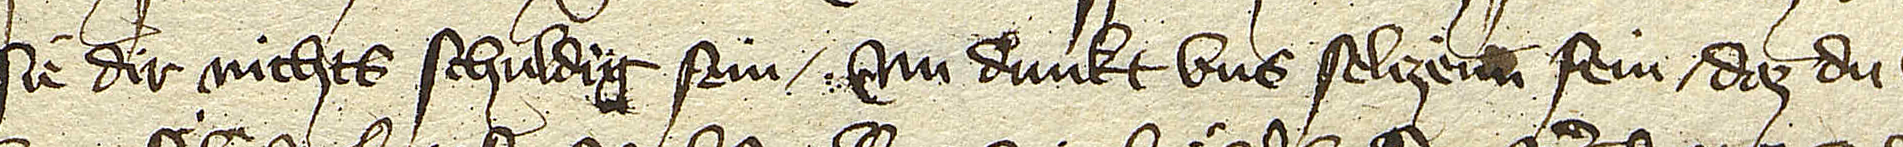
ſie dir nichts ſchuldig ſein / . Nu dunkt vns ſelcʒeim ſein / daʒ du
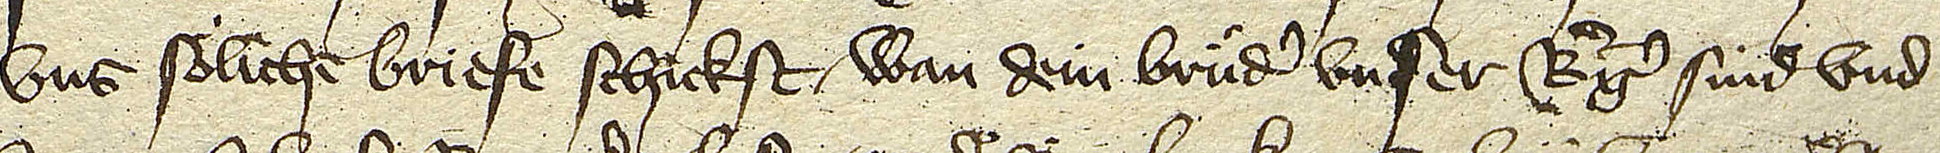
vns ſöliche briefe ſchickſt / wan dei brüd* vnſer B*g* ſind vnd
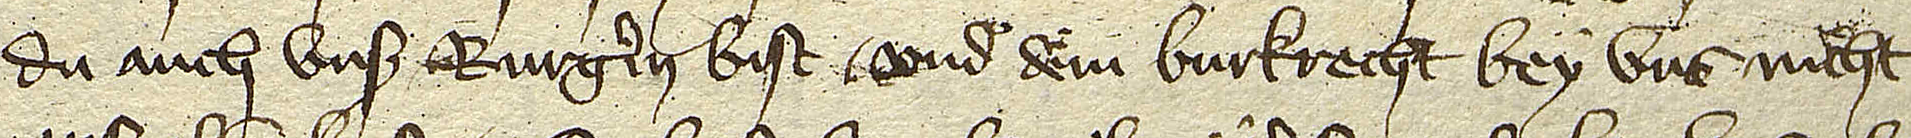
du auch vnſ* Burg*in biſt / vnd dem burkrecht bey vns nicht
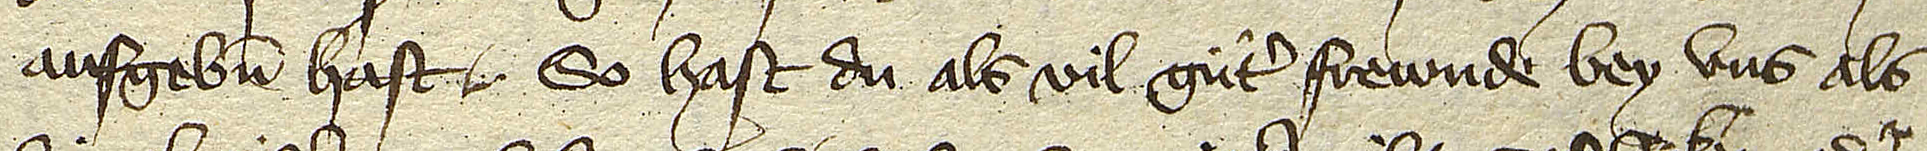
aufgebn* haſt / . So haſt du als vil güt* frewnde bey vns als
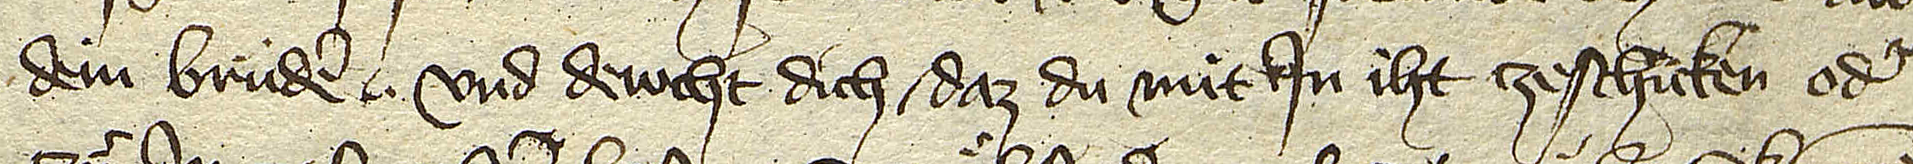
dein brüde* / . vnd dewcht dich / daʒ du mit In iht cʒeſchicken od*
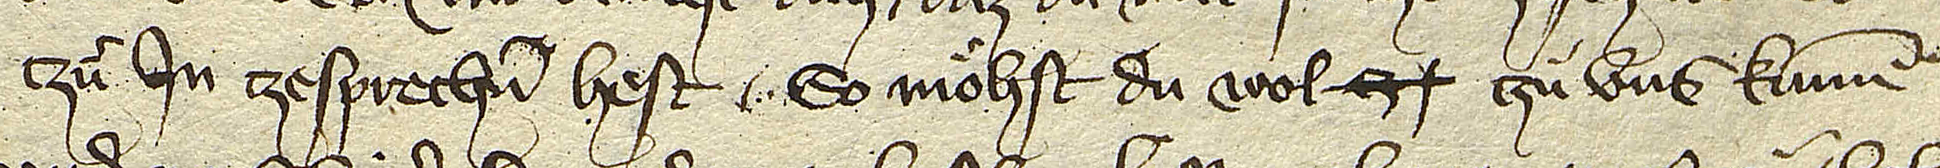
cʒü In cʒeſprechn* heſt / So möhſt du wol cʒ ſ cʒü vns kume*
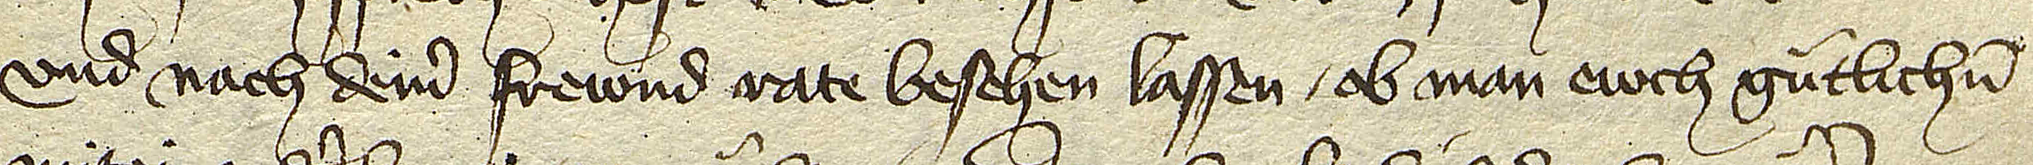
vnd nach dein* frewnd rate beſehen laſſen / ob man ewch gütlichn*
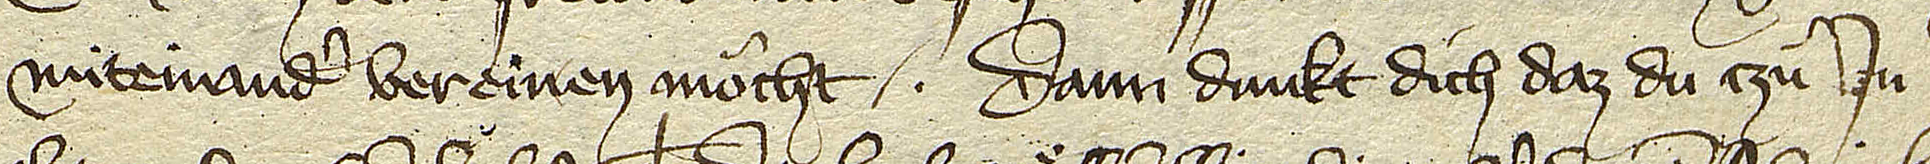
miteinand* vereinen möcht / . Dann dunkt dich daʒ du cʒü In
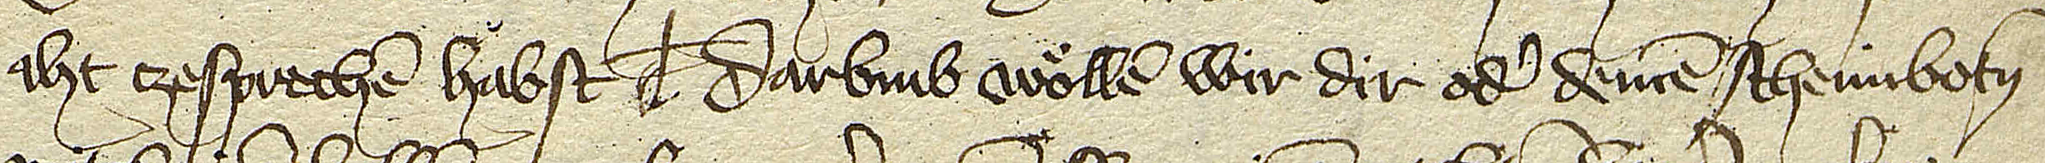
iht cʒeſpreche* habſt Darvmb wölle* wir dir od* deine* ſcheimbotn*
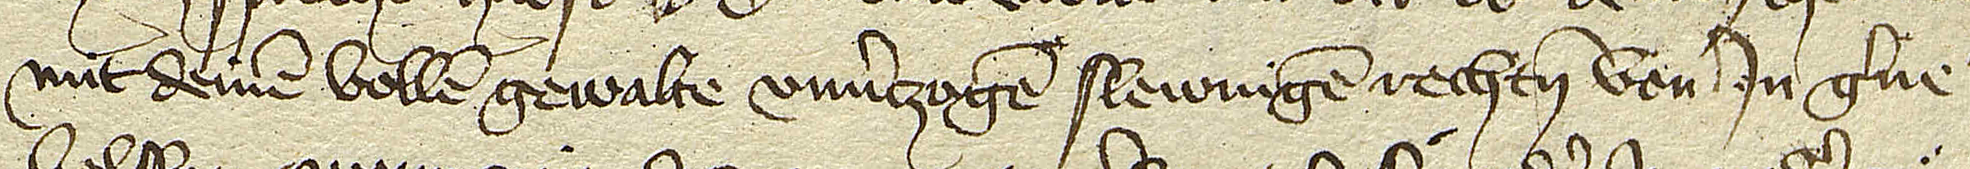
mit deine* volle* gewalte vnu*cʒoge* ſlewnige* rechtn* von In g*ne
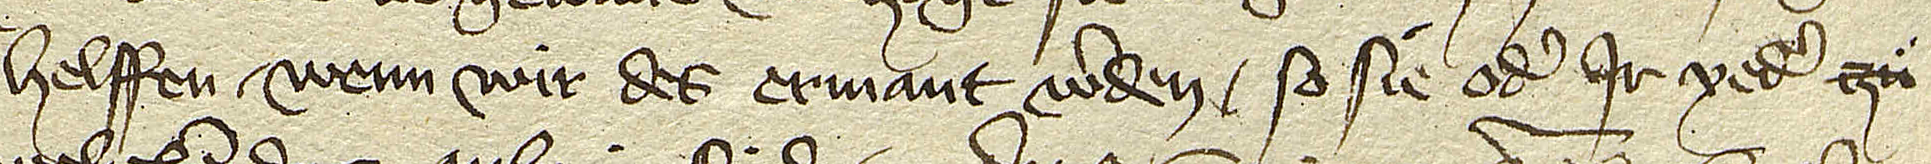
helffen / wenn wir des ermant w*den / ſo ſie od* Ir yed* cʒü
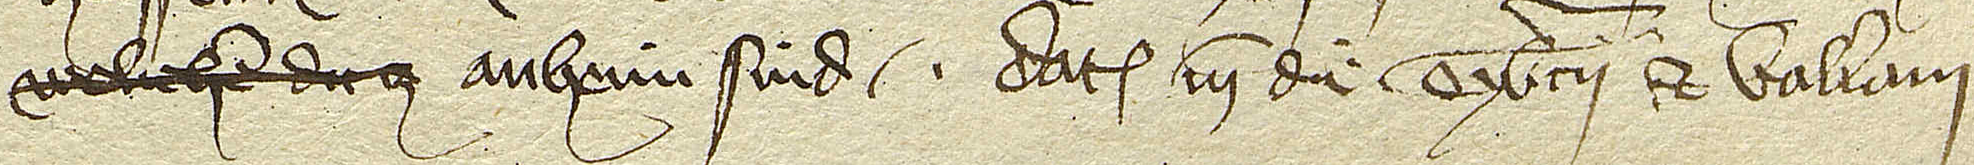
weliche* du cʒ anheim ſind / . Dat* in* die Tybcii @ Valiani*
